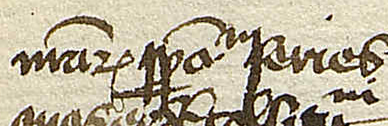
n*ra* p*po* feries
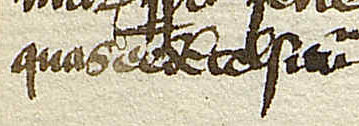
quas eede* celſitru*
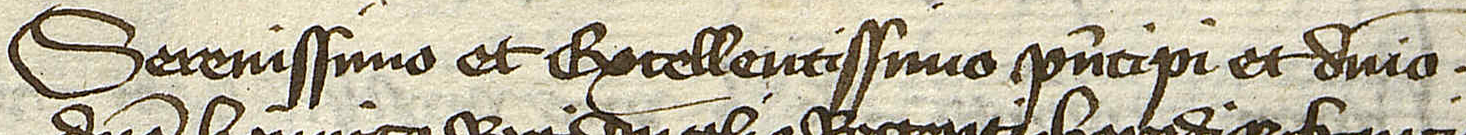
Sereniſſimo et Excellentiſſimo p*ncipi et d*nio .
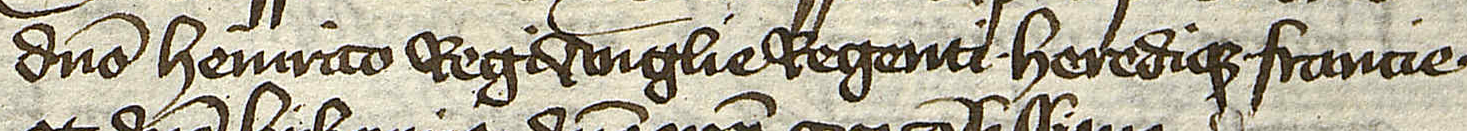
d*no Heinrico Regi Anglie Regenti . Herediq* Francie .
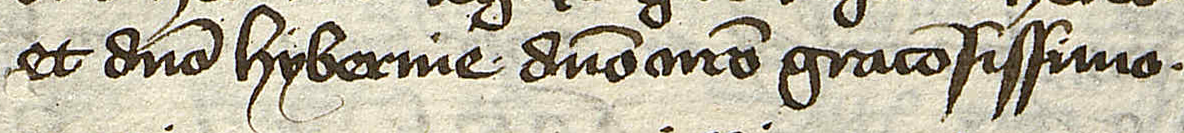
et d*no Hybernie d*no n*ro grac*oſiſſimo .
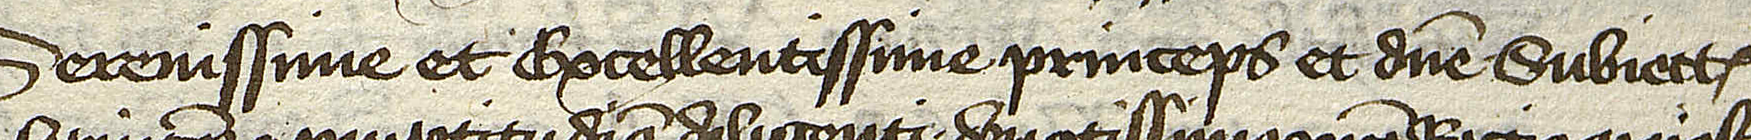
Sereniſſimo et Excellentiſſime princeps et d*ne Subiect*
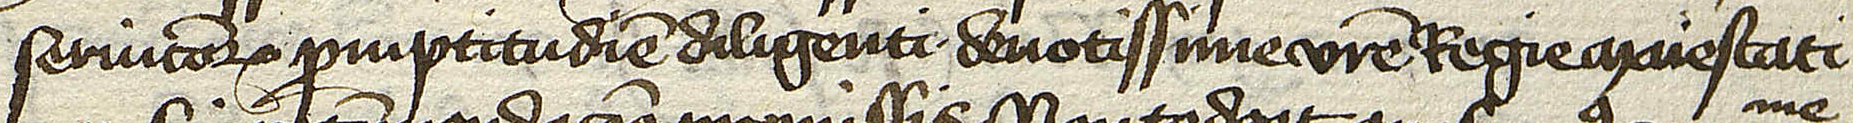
ſeruit*o* p*mptitudi*e diligenti deuotiſſime v*re Regie Maieſtati
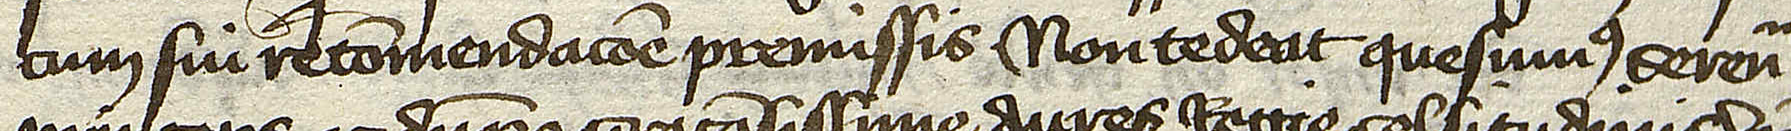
cum ſui reco*mendac*o*e premiſſis Non cedeat que ſum* Seren*
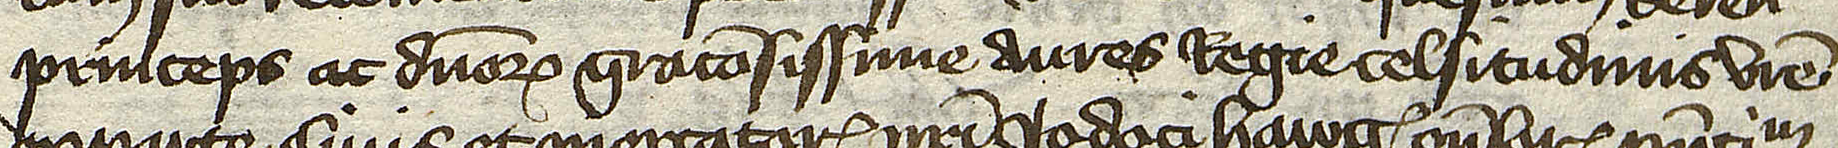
princeps ac d*no* grac*oſiſſime Aures Regie celſitudinis v*re
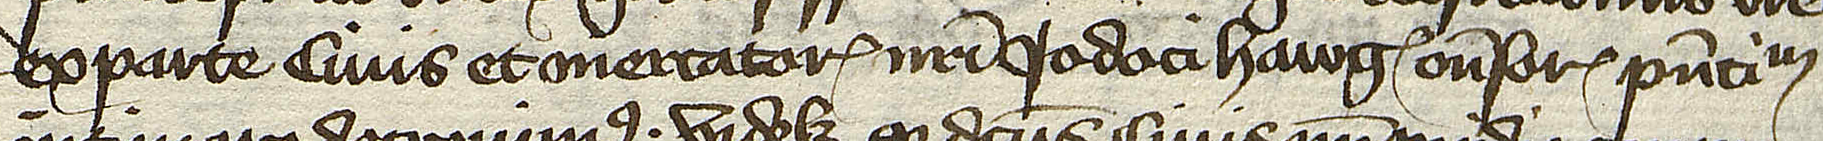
ex parte Ciuis et mercator* n*ri Iodoci Hawg* o*n*for*p*nci*
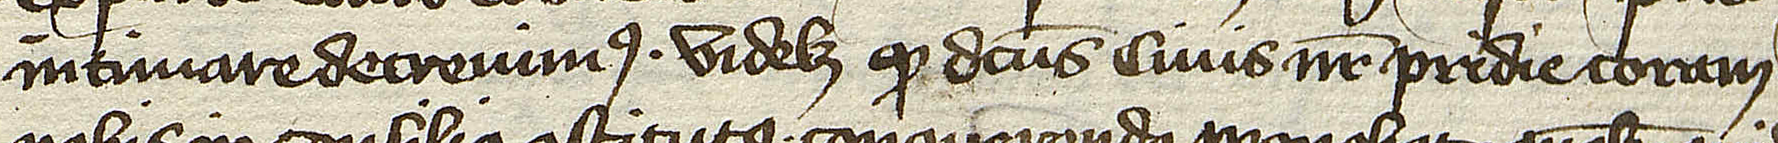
intimare decreuim* . videl* q* d*tus Ciuis n*er pridie coram
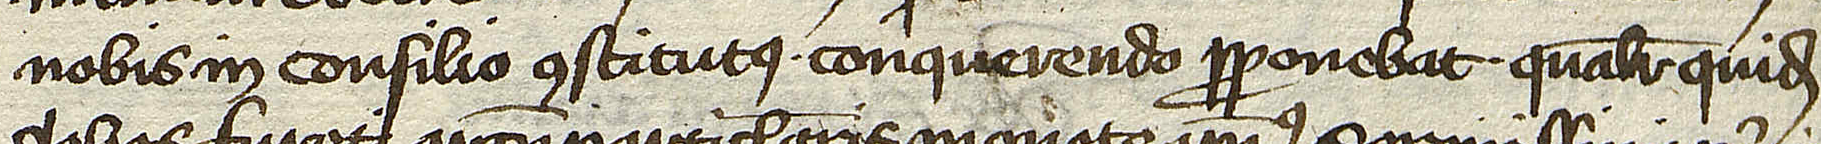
nobis in Consilio *ſtitut* . conquerenda p*ponebat . quali*r quid*
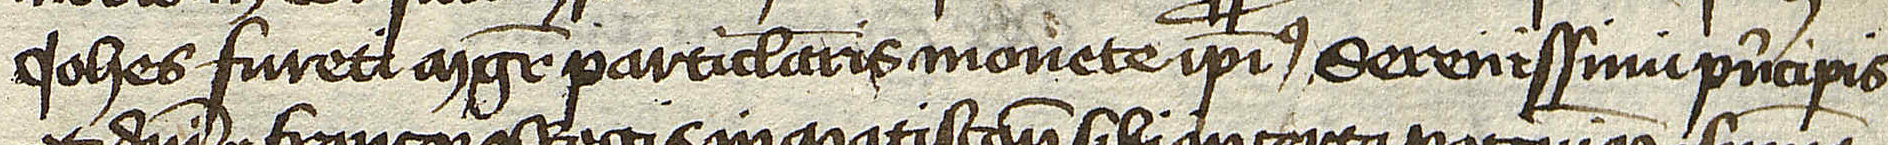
Ioh*es Fuerti M*g*r partic*laris monete ip*i* Sereniſſimi p*ncipis
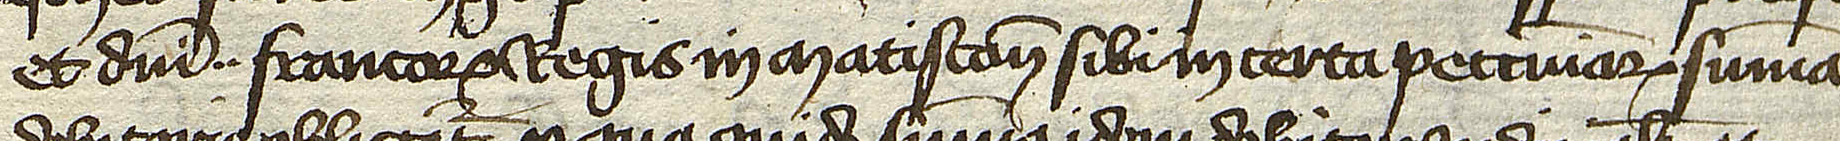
et d*ni ~ Franco* Regis in Matiſcon* ſibi incerta peccunia* ſum*a
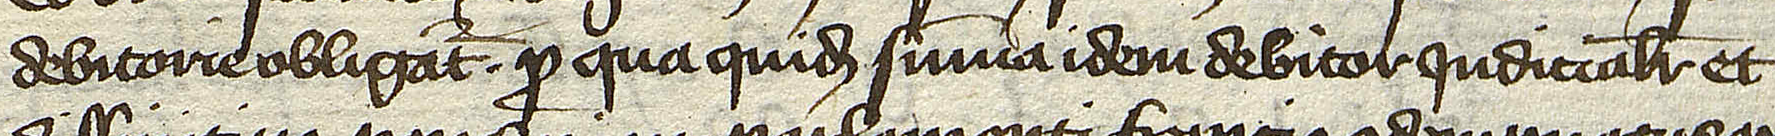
debitore obligat* . P* qua quid* ſum*a idem debitor Iudical*r et
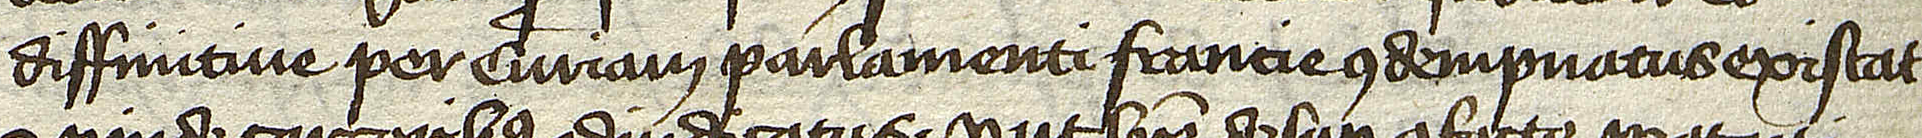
diffinitiue per Curiam parlamenti Francie *demnatus exiſtat
